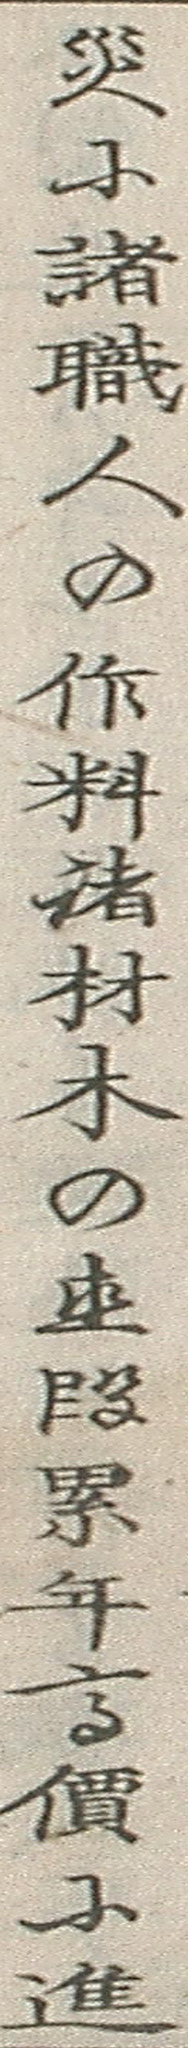災に諸職人の作料諸材木の値段累年高価に進
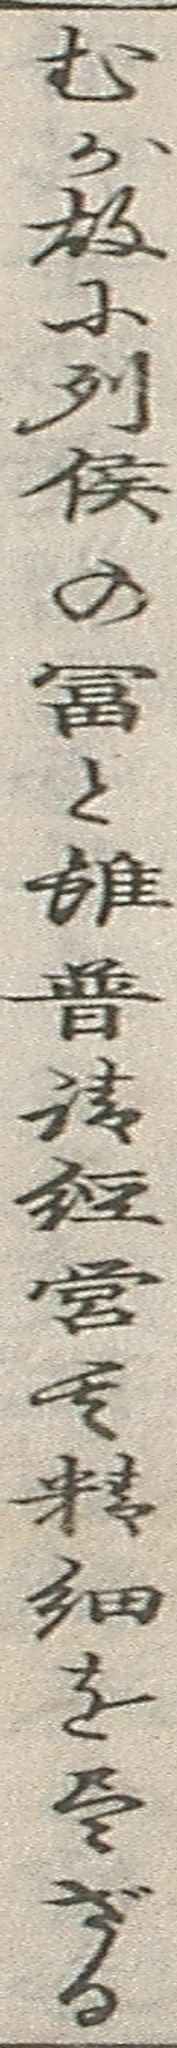むが故に列侯の冨と雖普請経営其精細を尽ざる
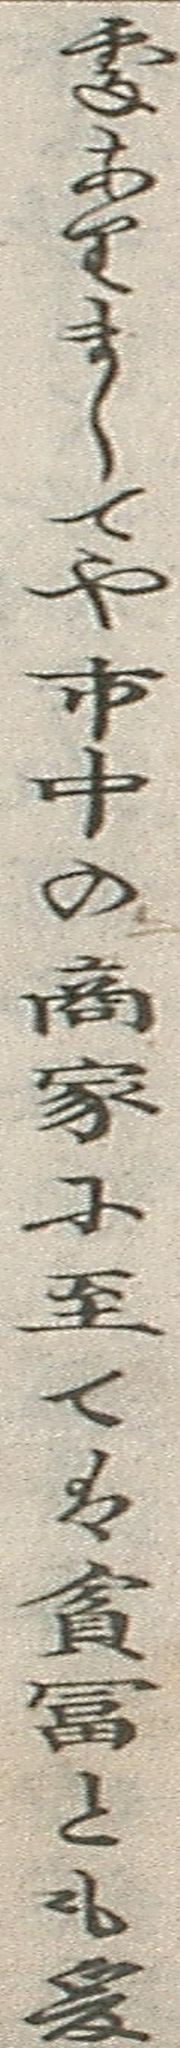処ありましてや市中の商家に至ては貧富とも爰
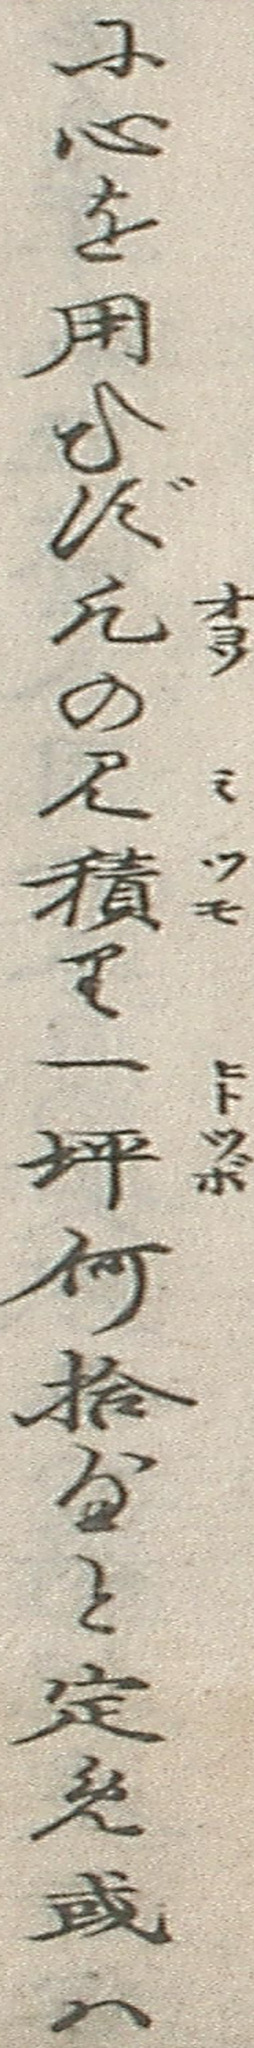に心を用ひず凡の見積り一坪何拾分と定め或は
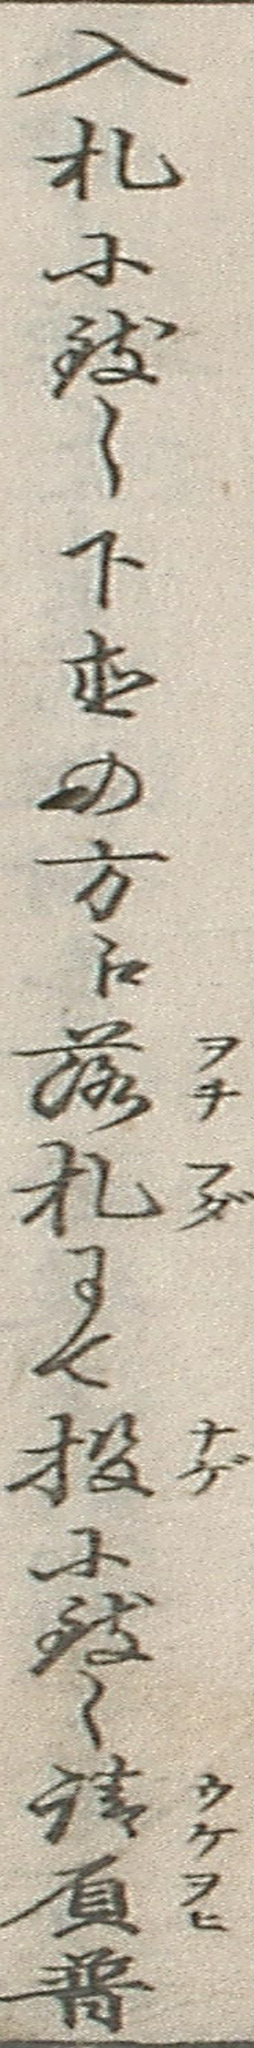入札に致し下直の方江落札にて投に致し請負普
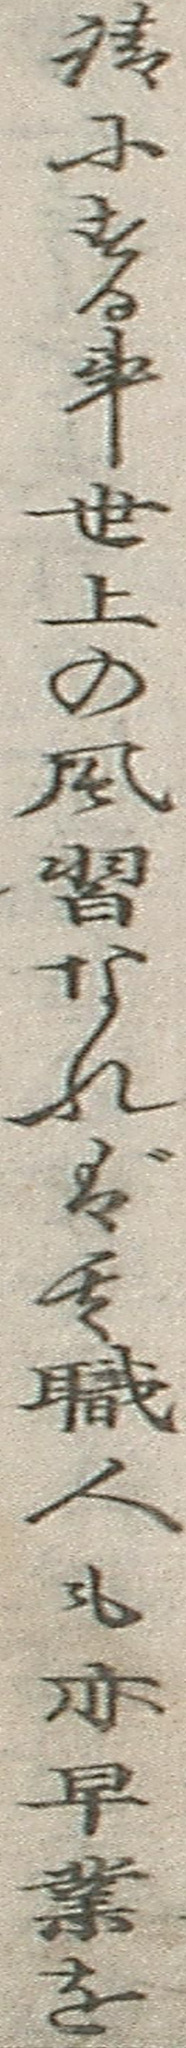請にする事世上の風習なれば其職人も亦早業を

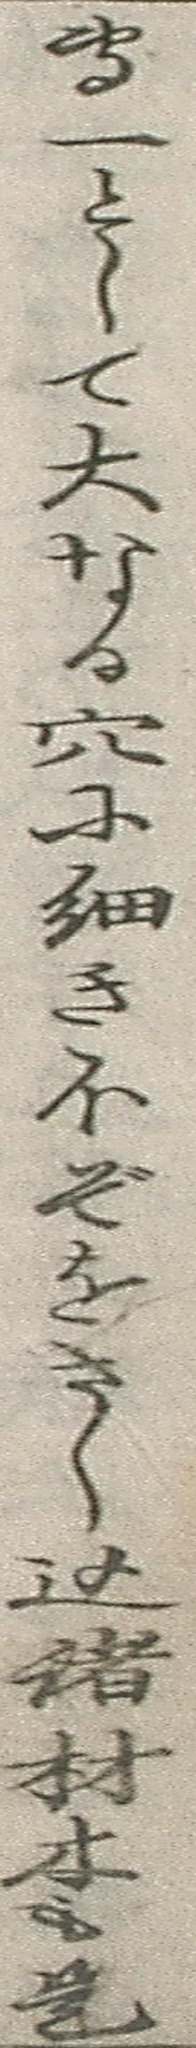専一として大なる穴に細きほぞをさし込諸材木も是
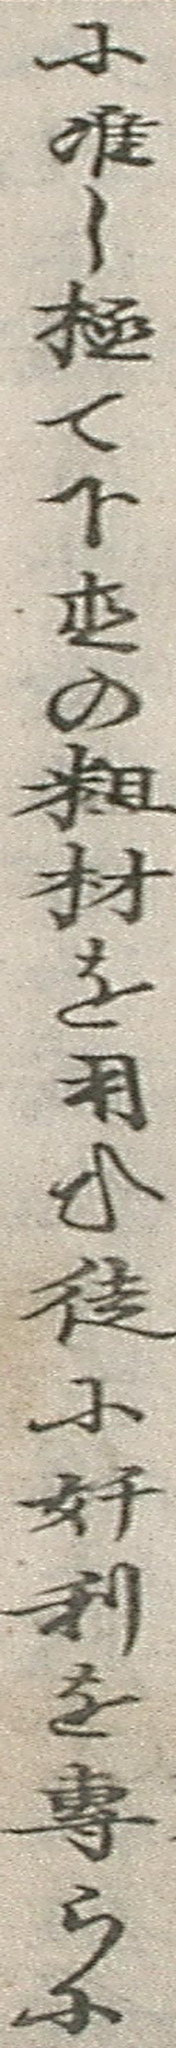に准し極て下直の粗材を用ひ徒に奸利を専らに
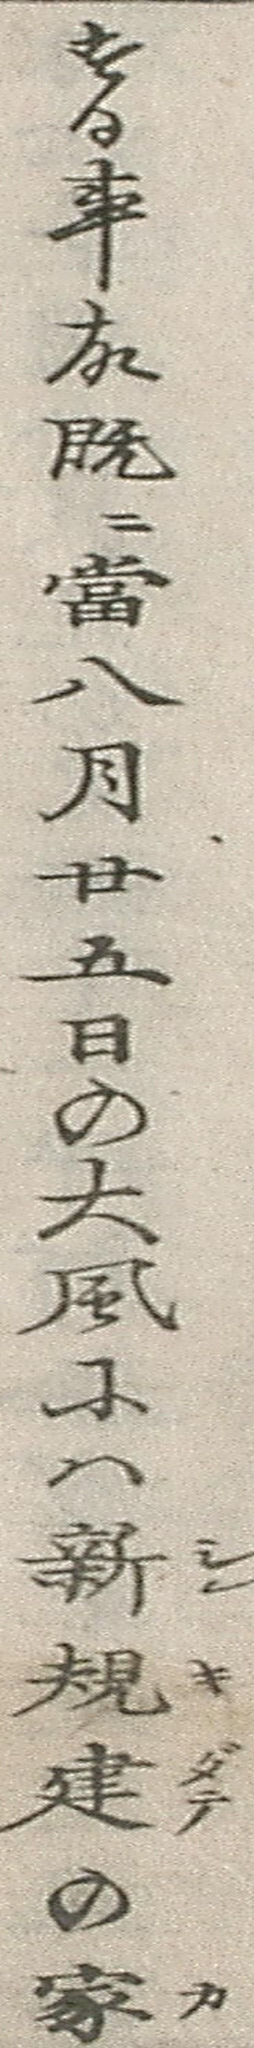する事故既ニ当八月廿五日の大風には新規建の家
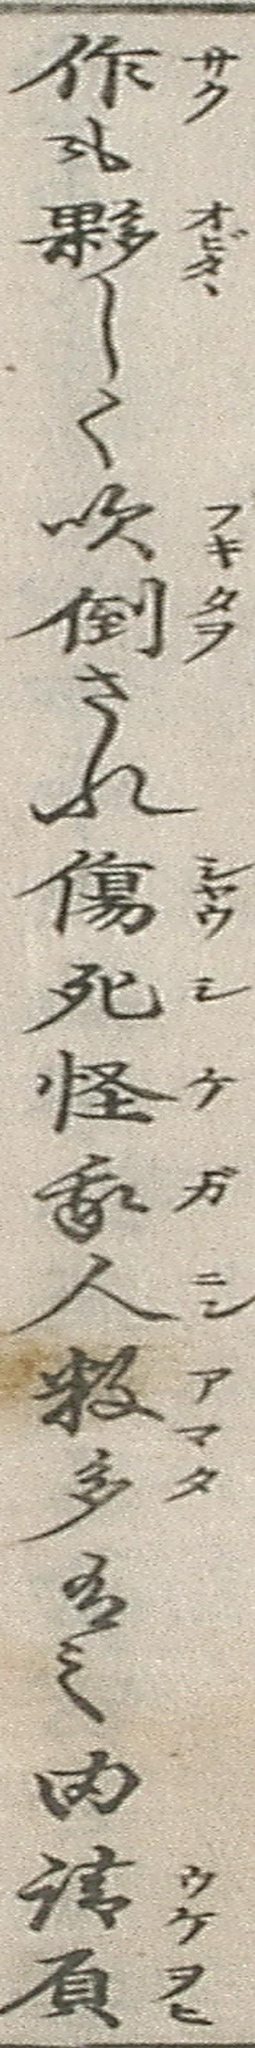作も夥しく吹倒され傷死怪我人数多有之由請負
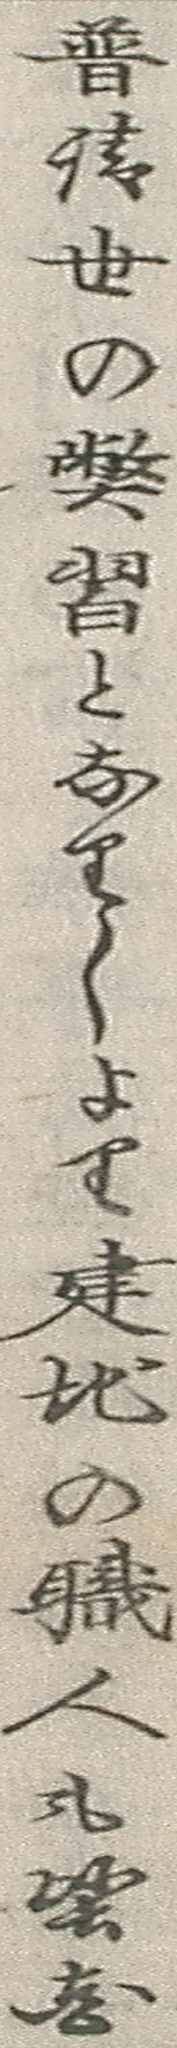普請世の弊習となりしより建地の職人も堅固
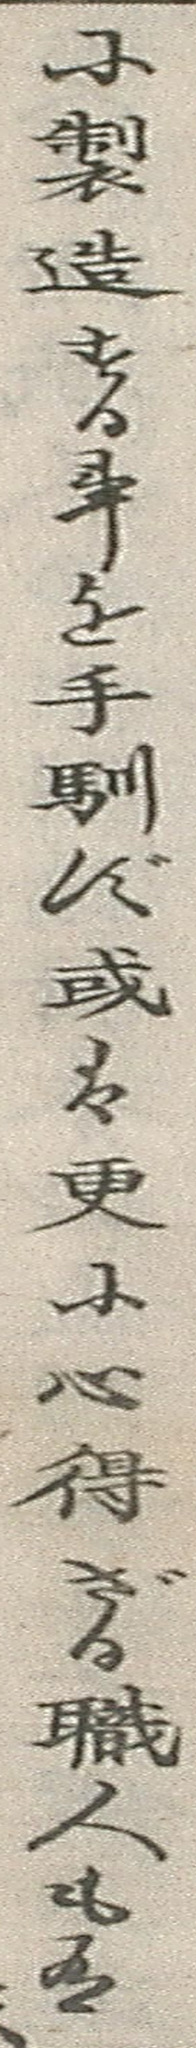に製造する事を手馴ず或は更に心得ざる職人も有之
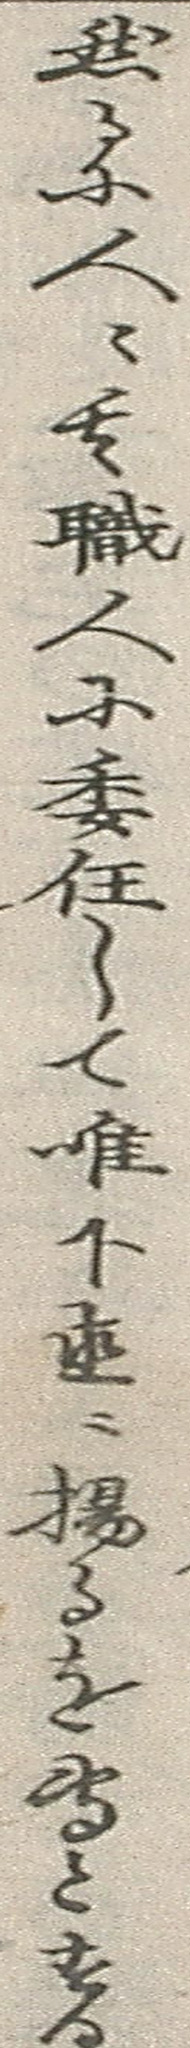然るに人〻其職人に委任して唯下直ニ揚るを専とする
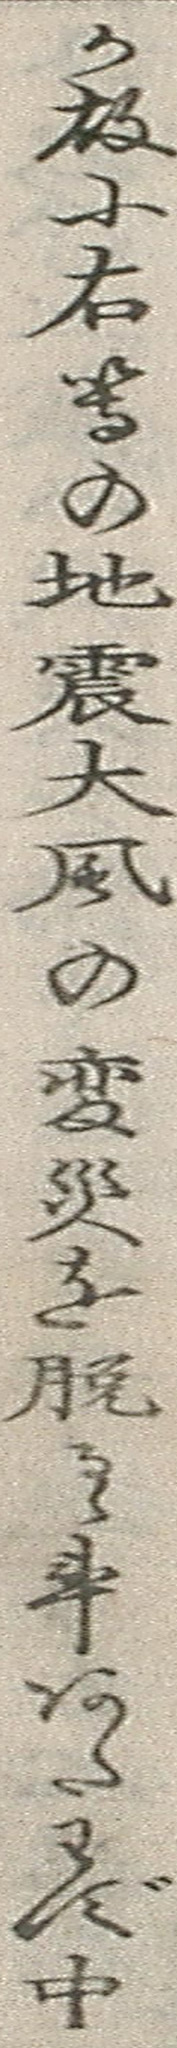か故に右等の地震大風の変災を脱るゝ事あたわず中
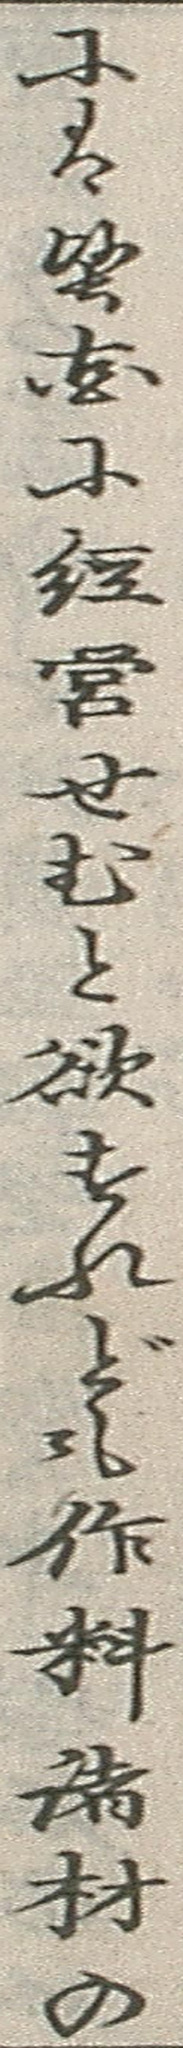には堅固に経営せむと欲すれども作料諸材の
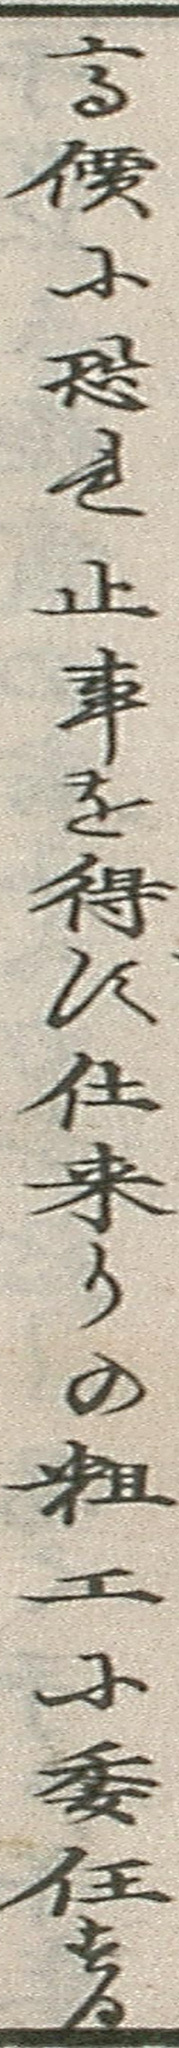高価に恐れ止事を得ず仕来りの粗工に委任する
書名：附録　地震劇風災害豫防法圖説（内題）
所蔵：東京大学地震研究所図書室 Earthquake Research Institute Library, The University of Tokyo, JAPAN
